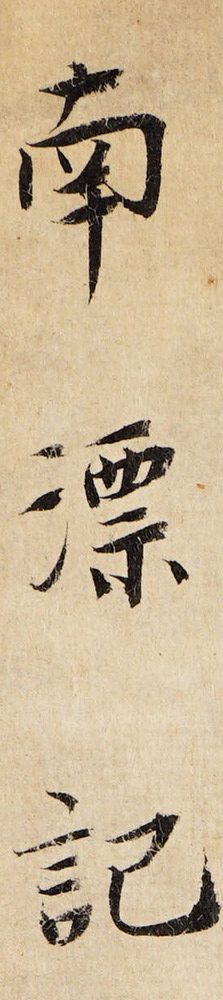南漂記

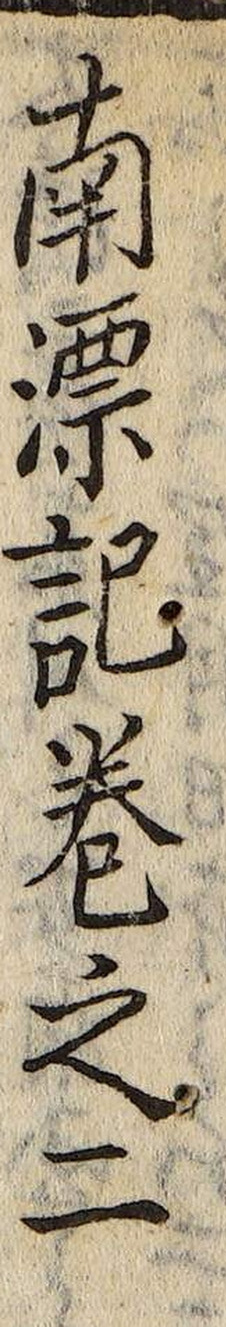南漂記巻之二
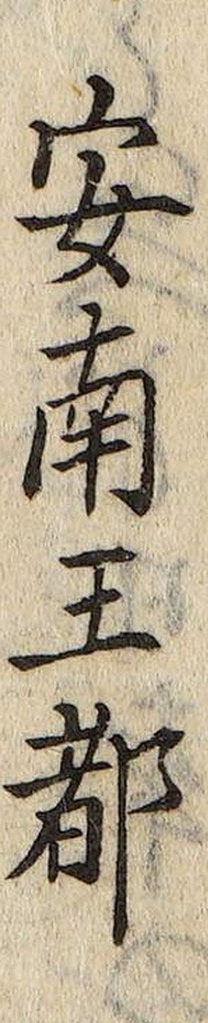安南王都
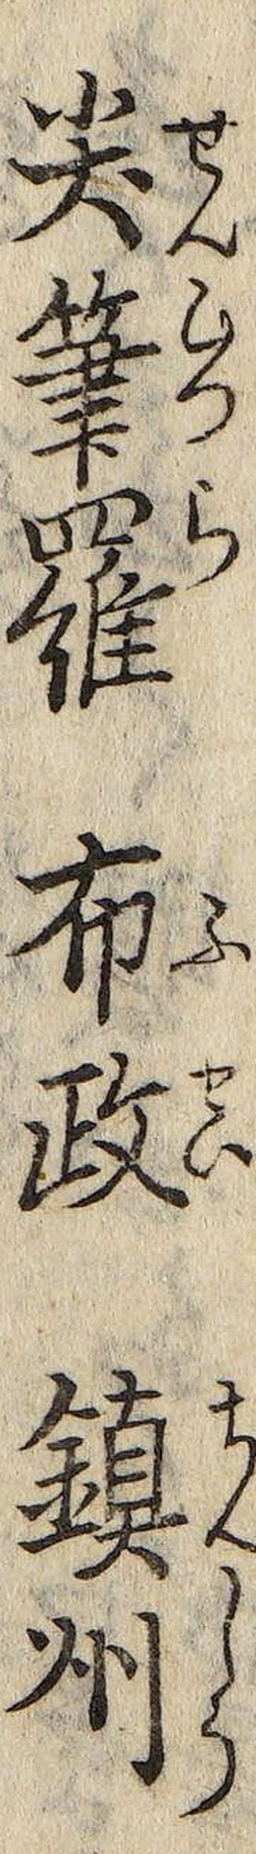尖筆羅布政鎮州
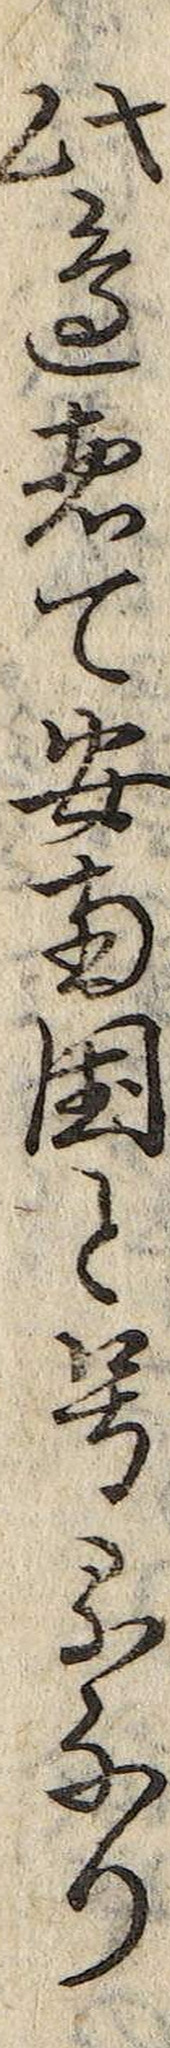此邊惣て安南国と号るなり
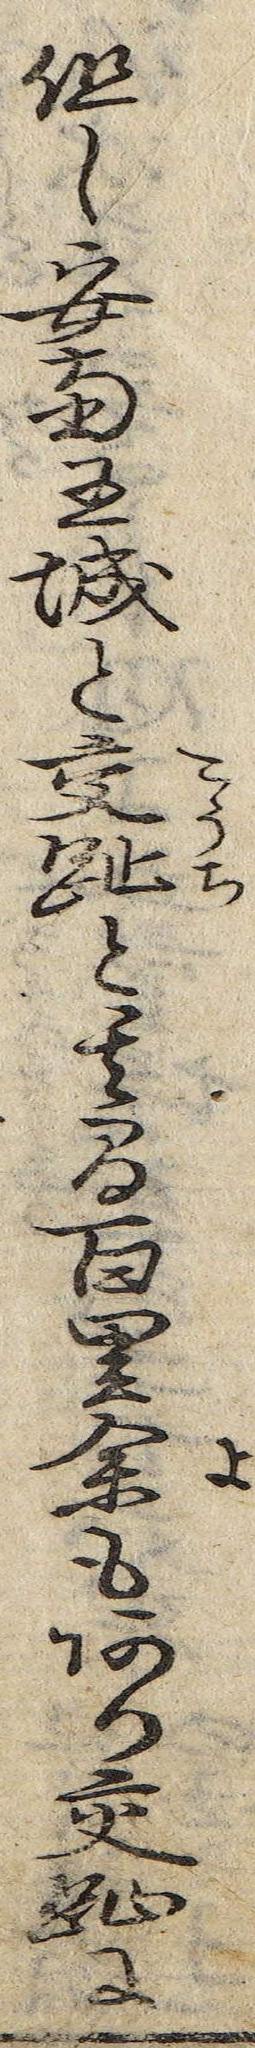但し安南王城と交趾と其間百里余もあり交趾に
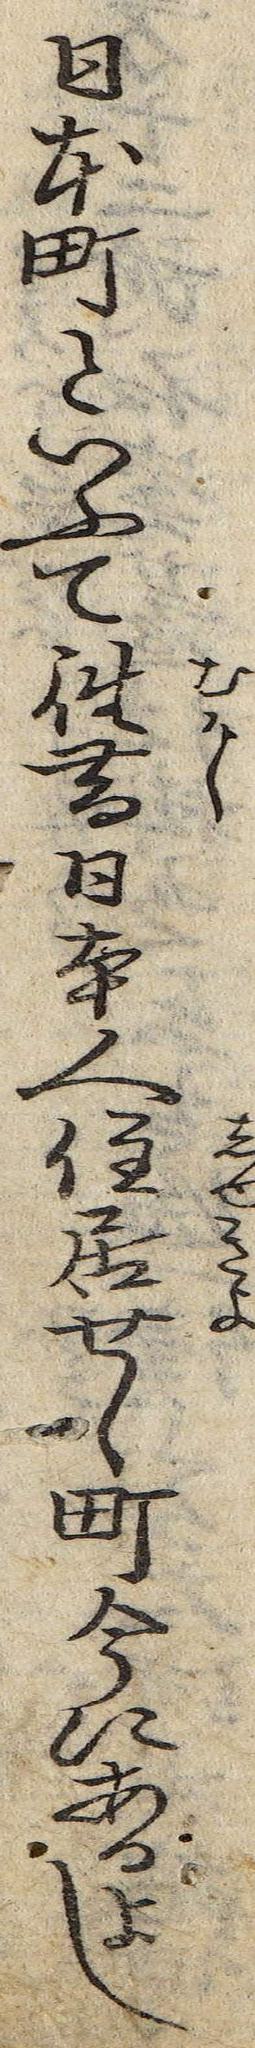日本町といふて往昔日本人住居せし町今にあるよし
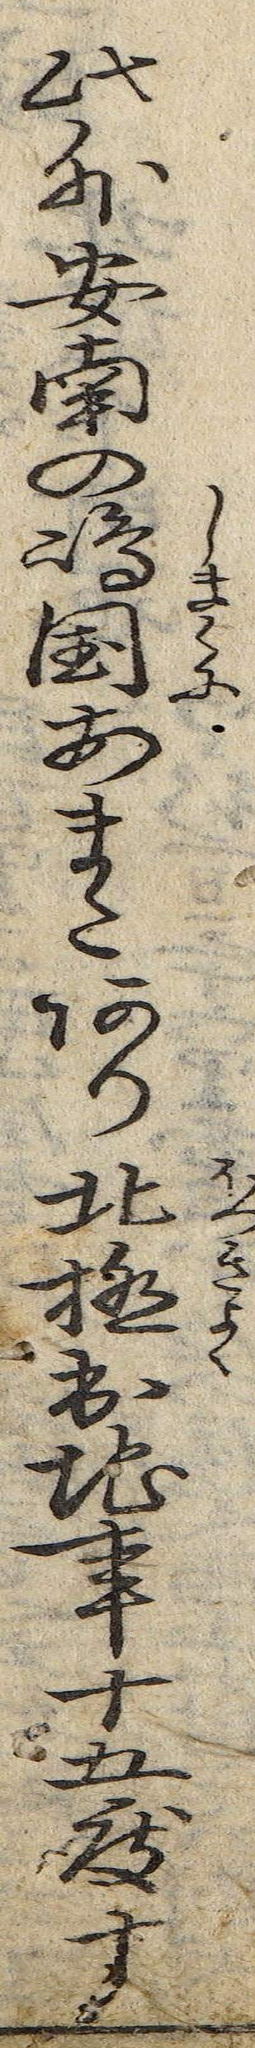此外安南の嶋国あまたあり北極出地事十五度十
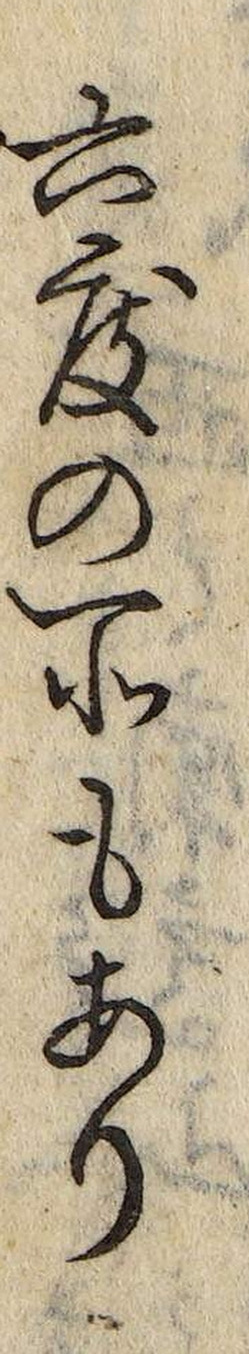六度の所もあり

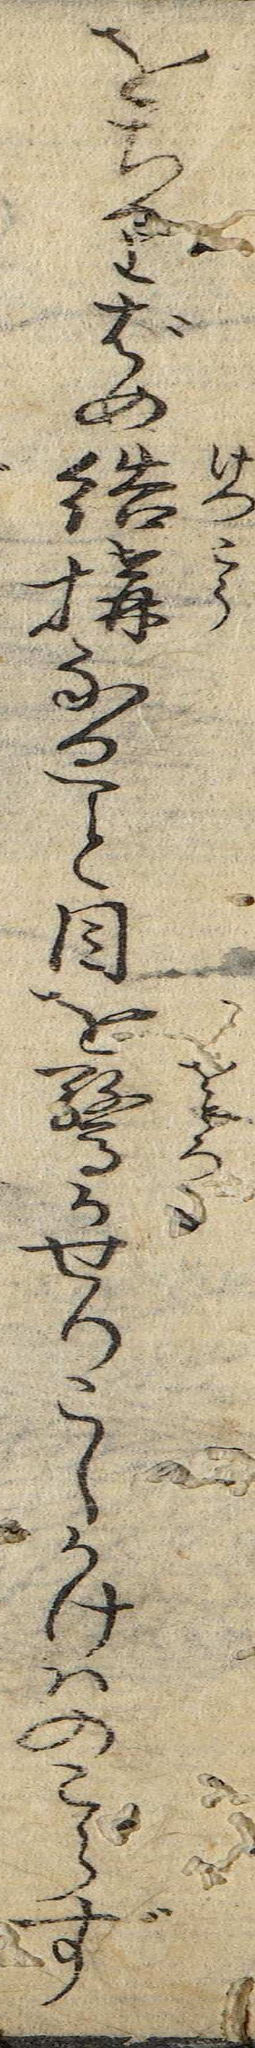をちりばめ結構なること目を驚かせりこしかけハのこらず
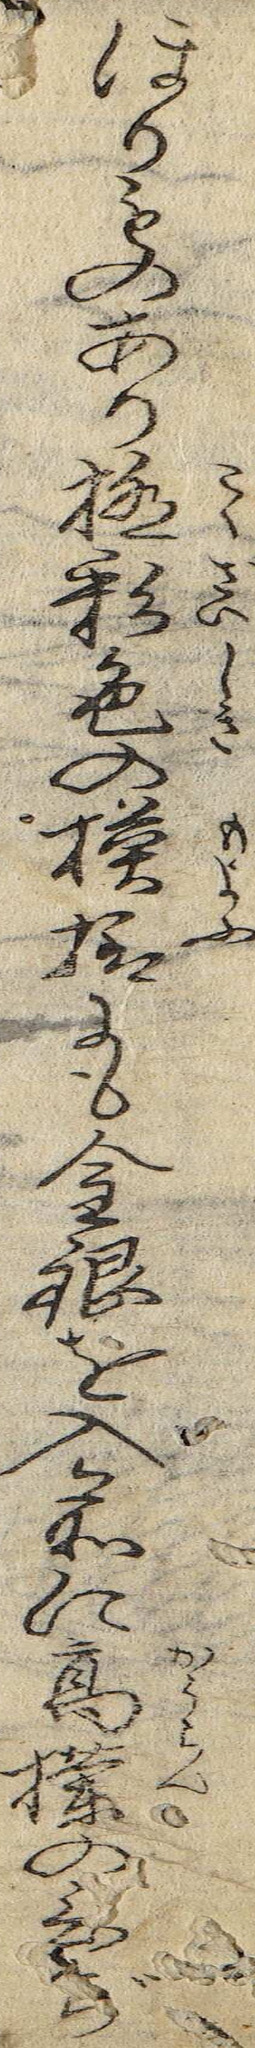ほりものあり極彩色の模様にも金銀を入候所に高欄のひぢ
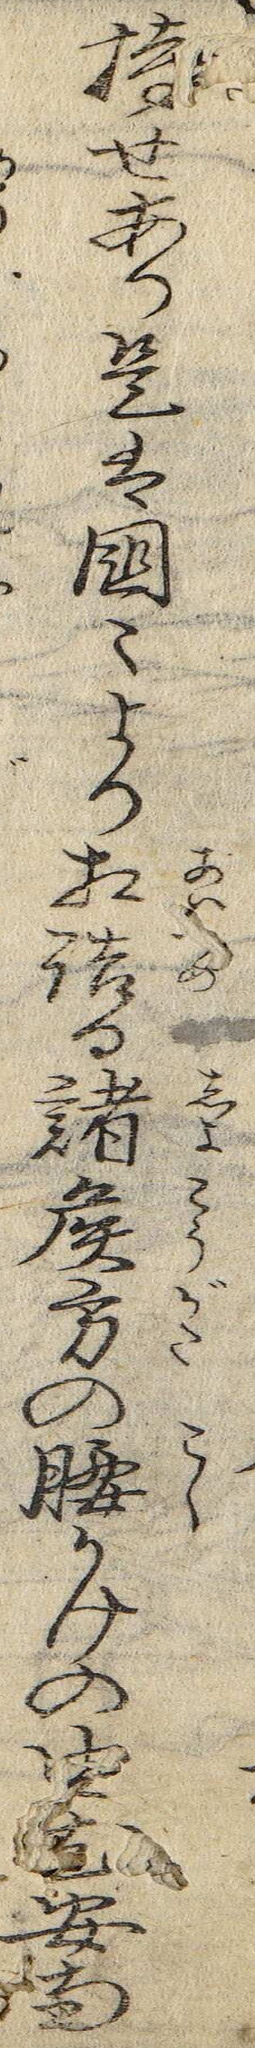持せあり是は國々より相詰る諸侯方の腰かけの由尤安南
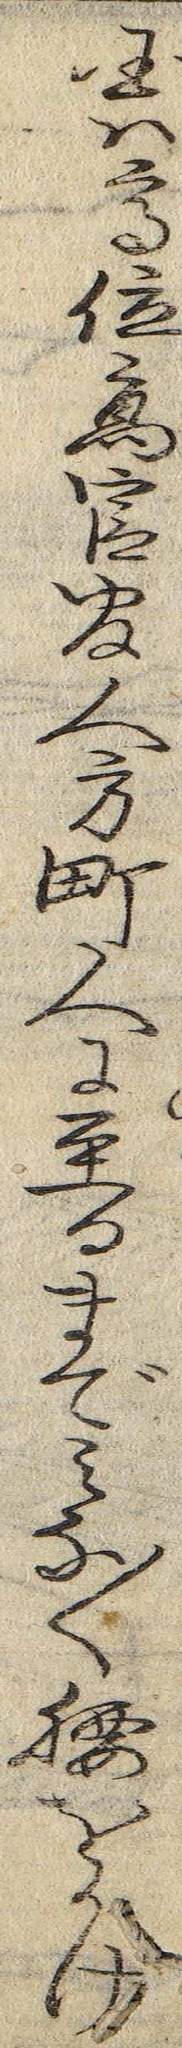国は高位嵩官官人方町人に至るまでみな〳〵腰をかけ
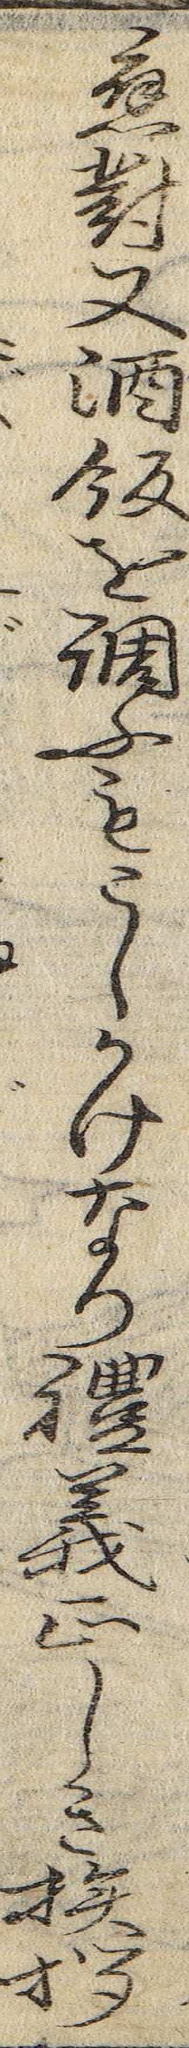應對又酒飯を調ふもこしかけなり禮義正しき挨拶
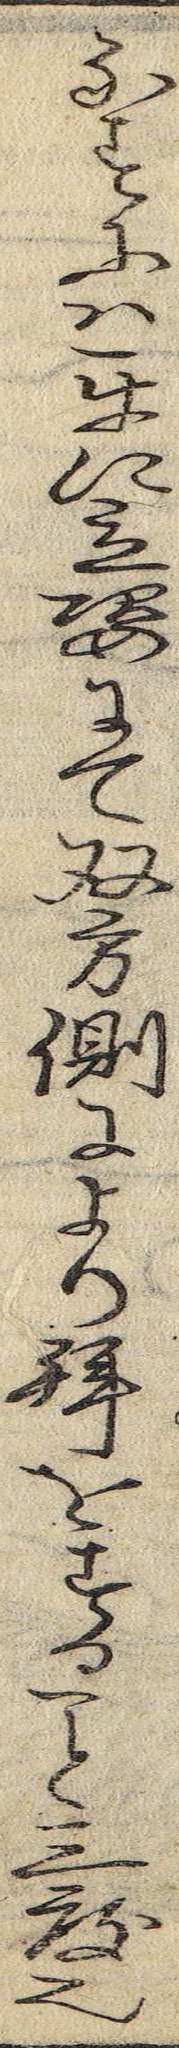なすにハ互に立姿にて双方側により拜をすること三度也
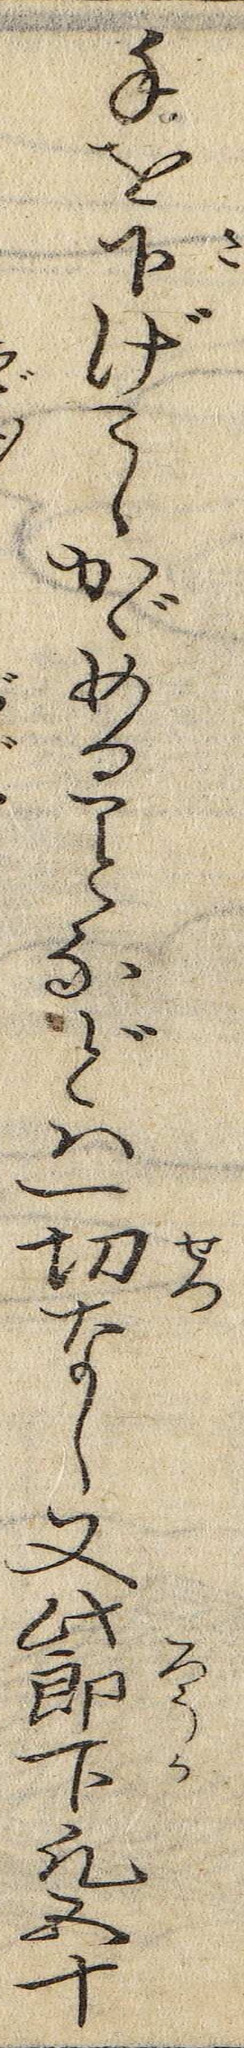手を下げこしかゞめることなどハ一切なし又郎下凡五十
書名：南漂記
